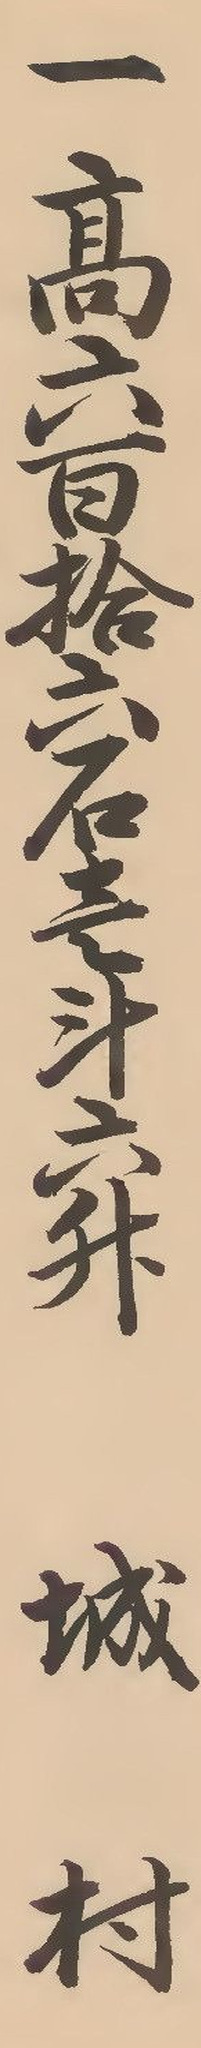一高六百拾六石壱斗六升城村
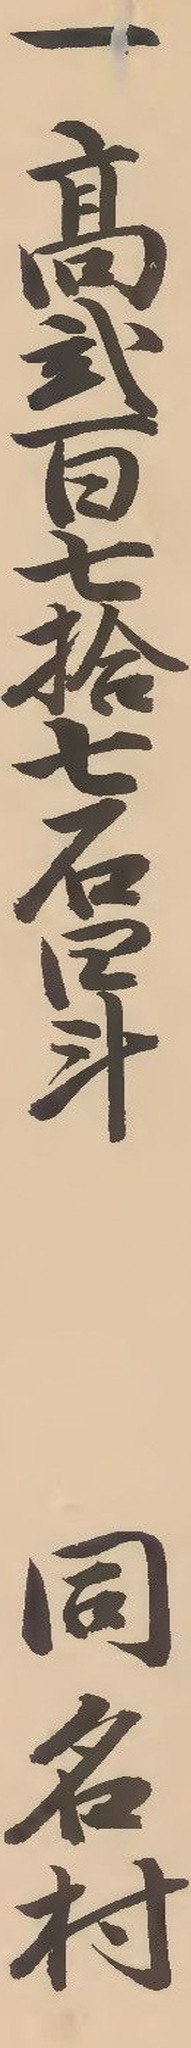一高弐百七拾七石四斗同名村
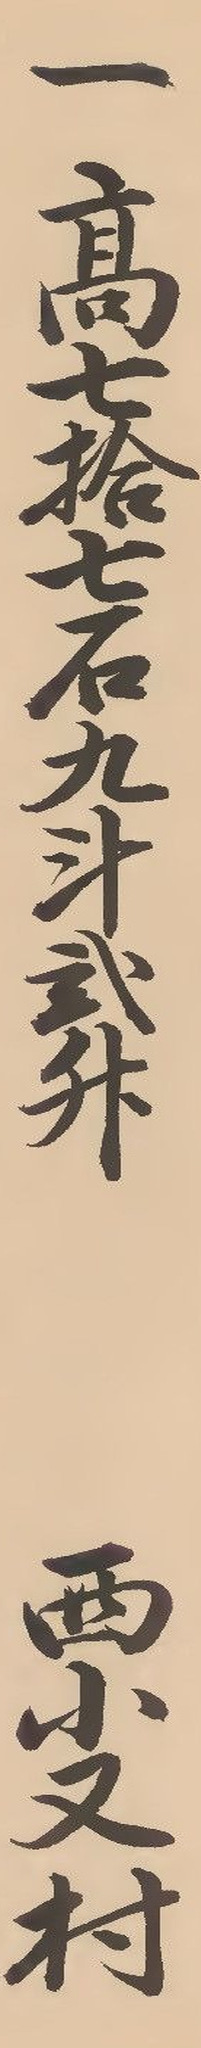一高七拾七石九斗弐升西小又村
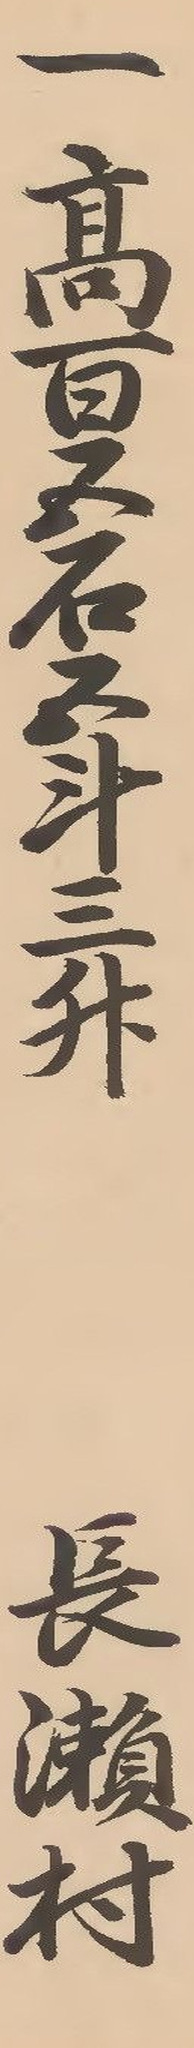一高百五石五斗三升長瀬村

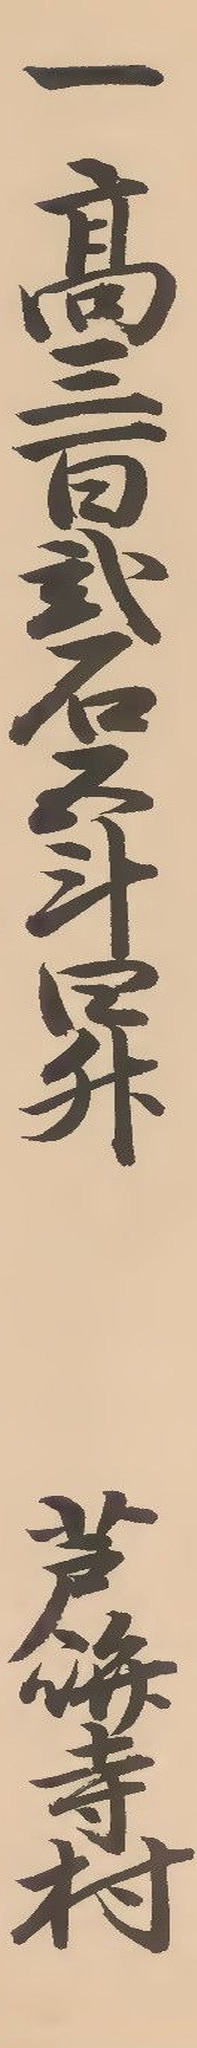一高三百弐石五斗四升芦峅寺村

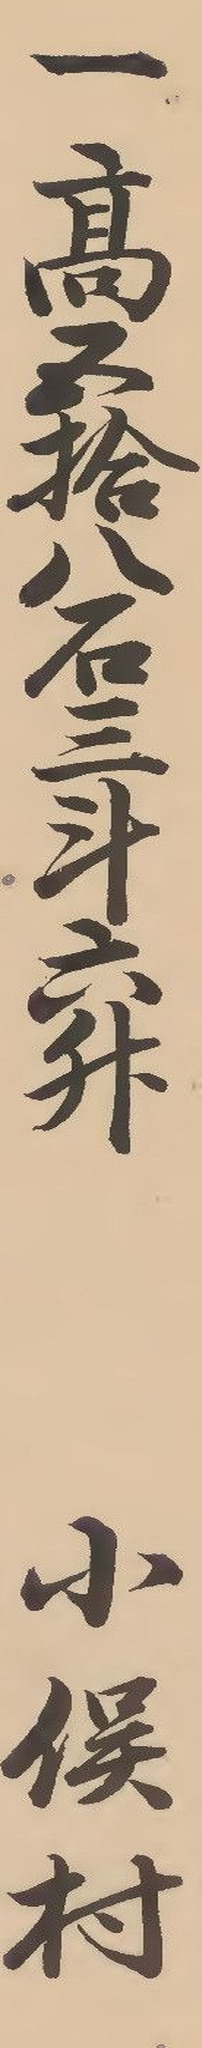一高五拾八石三斗六升小俣村
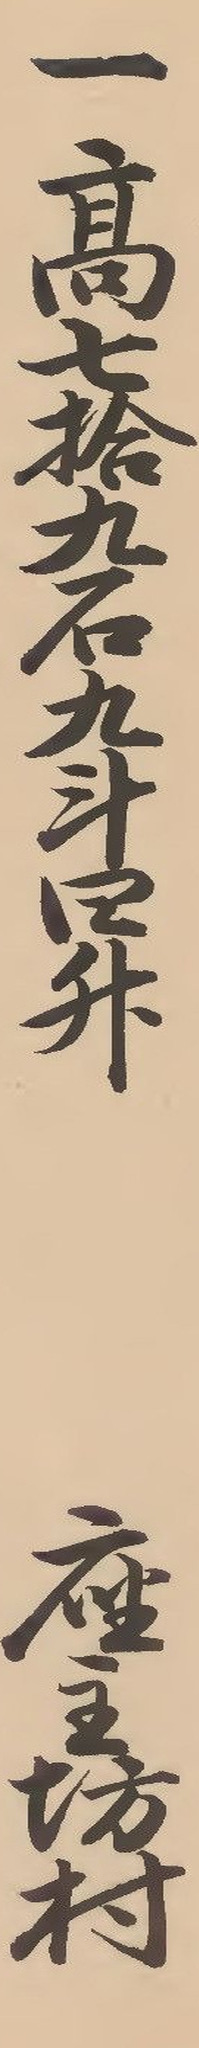一高七拾九石九斗四升座主坊村
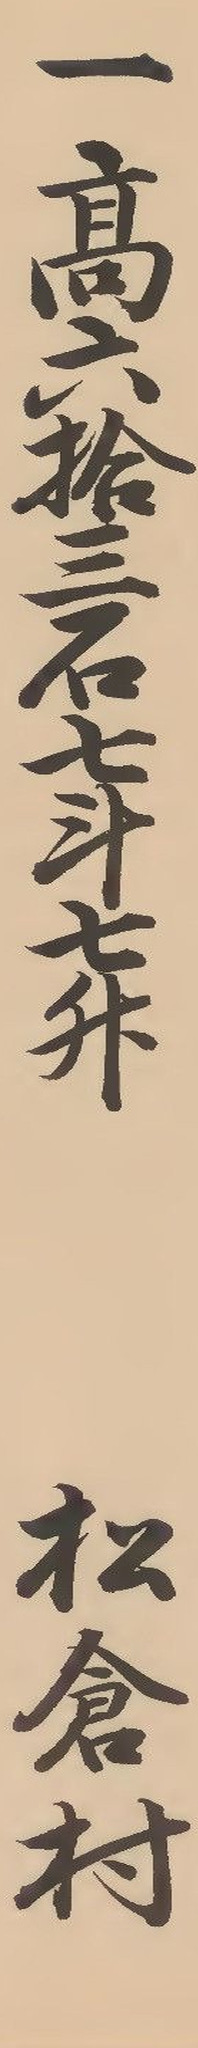一高六拾三石七斗七升松倉村
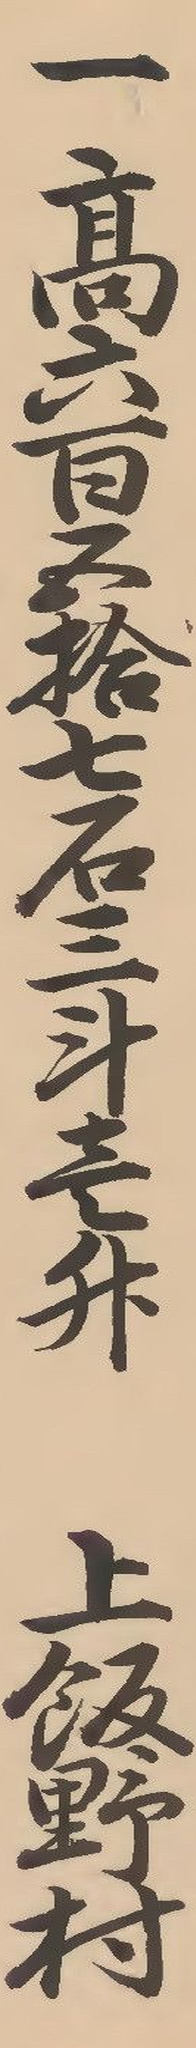一高六百五拾七石三斗壱升上飯野村
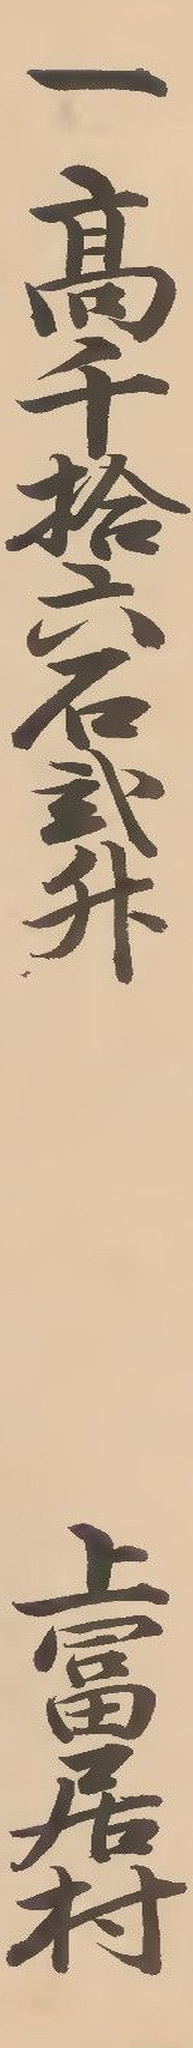一高千拾六石弐升上富居村
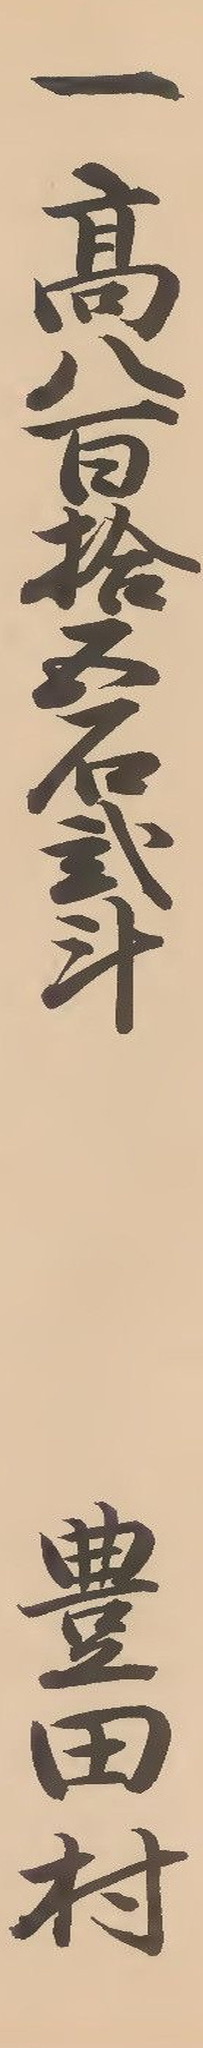一高八百拾五石弐斗豊田村
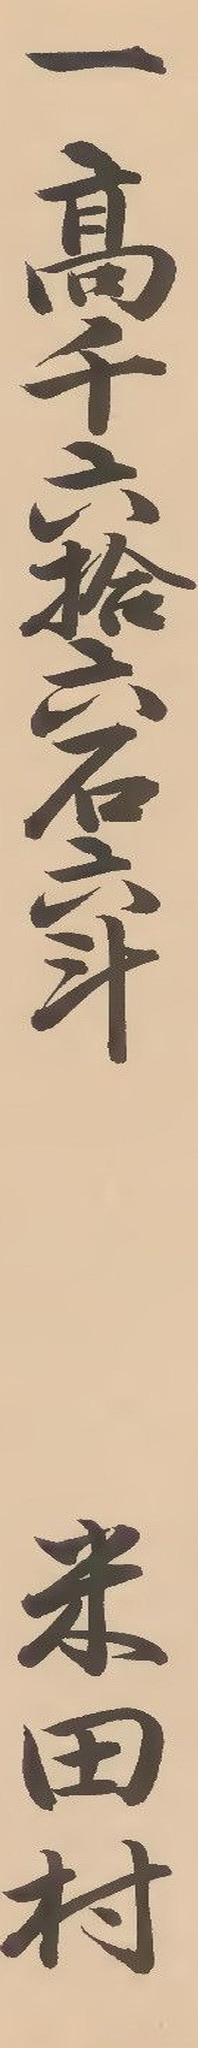一高千六拾六石六斗米田村
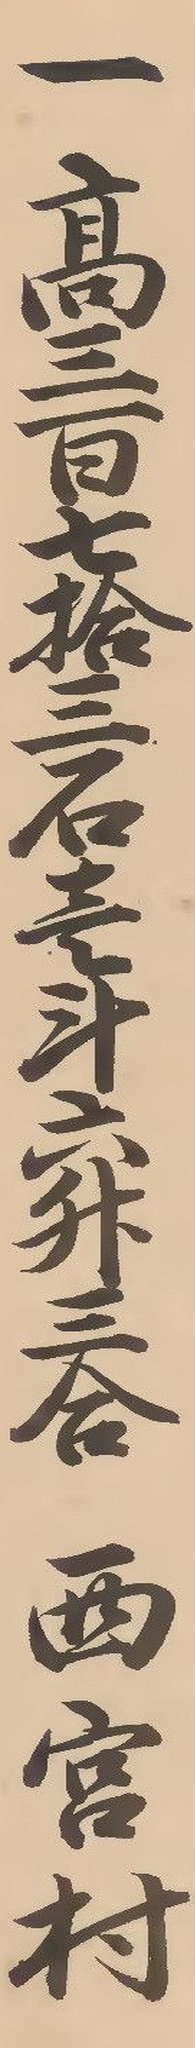一高三百七拾三石壱斗六升三合西宮村

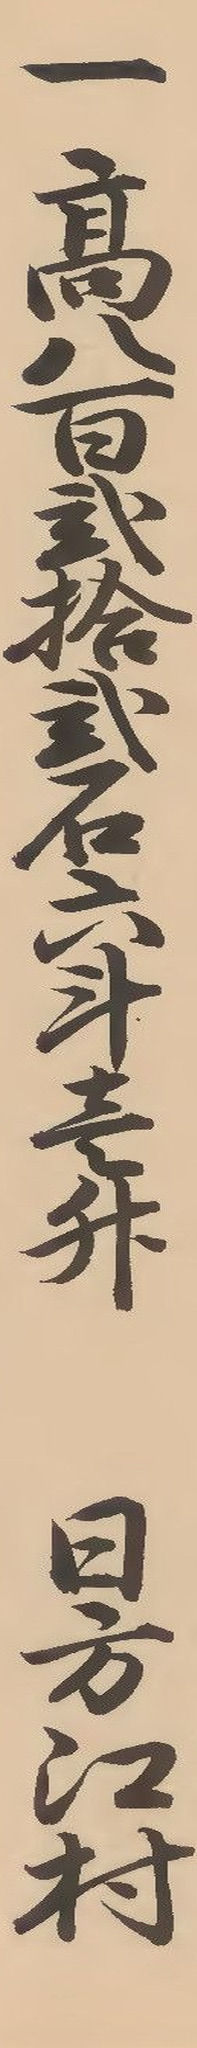一高八百弐拾弐石六斗壱升日方江村
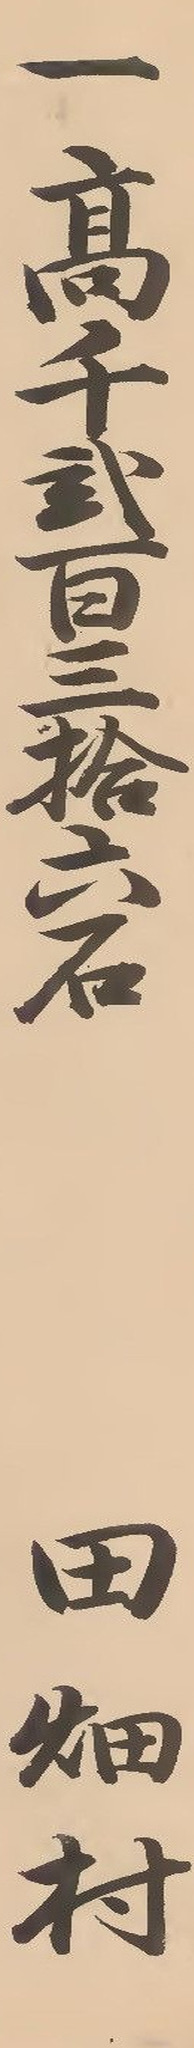一高千弐百三拾六石田畑村
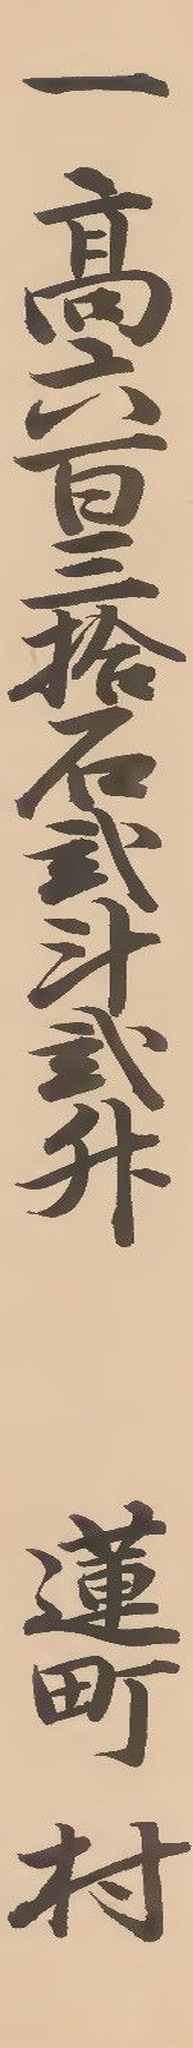一高六百三拾石弐斗弐升蓮町村
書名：越中国郷帳
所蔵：国立公文書館 National Archives of Japan
